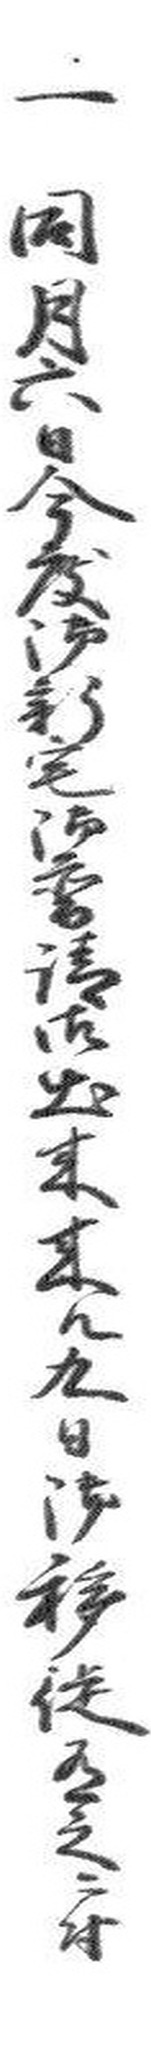一同月六日今度御新宅御普請御出来来ル九日御移徙有之ニ付
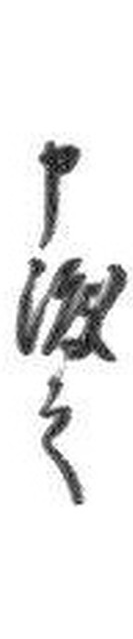申渡之
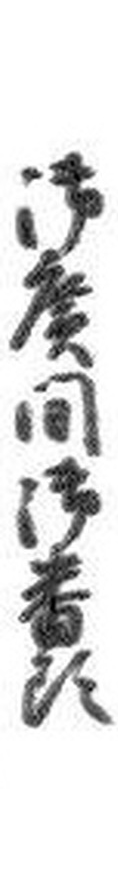御広間御番頭
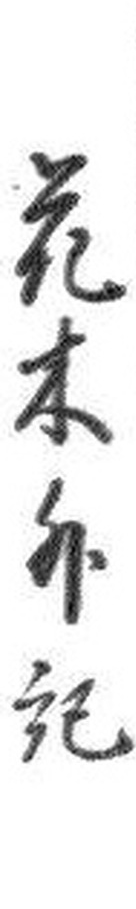花木外記
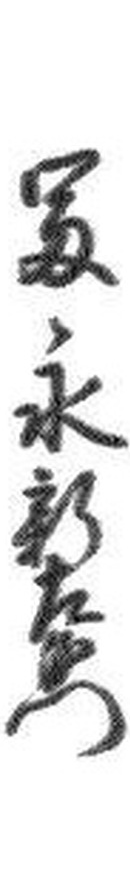富永新左衛門
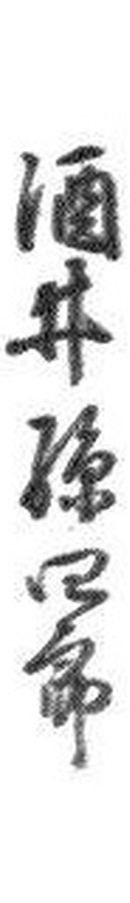酒井孫四郎
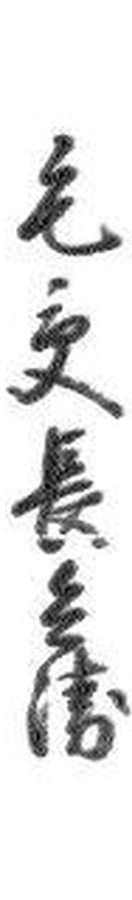毛受長兵衛
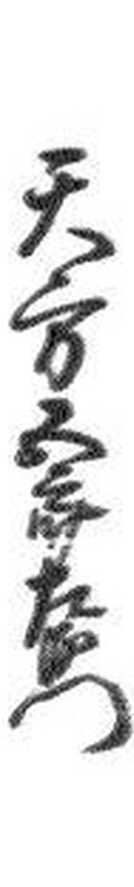天方五郎左衛門
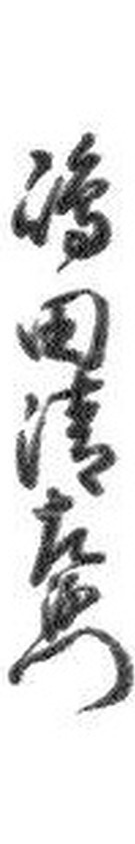嶋田清左衛門
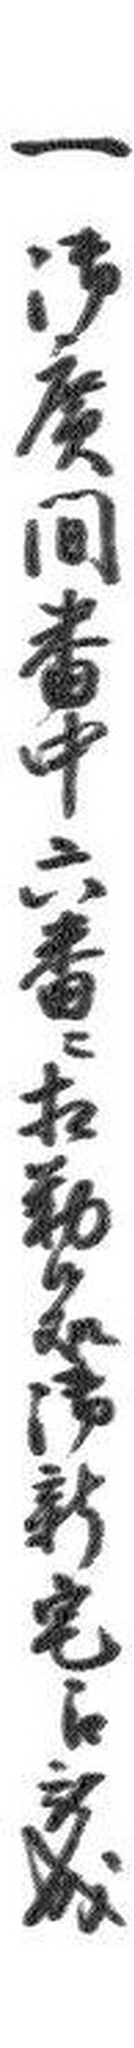一御広間番中六番ニ相勤候処御新宅江被成

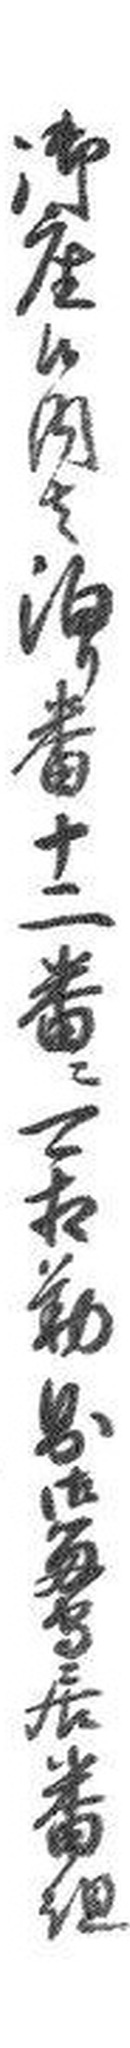御座候内者泊り番十二番ニ可相勤即御留守居番組
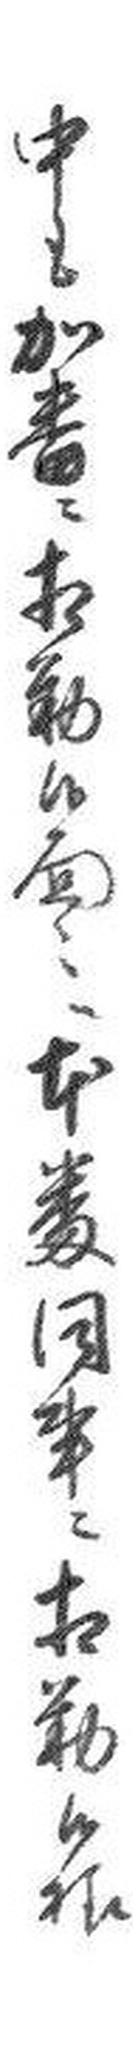中も加番ニ相勤候面々本番同事ニ相勤候様
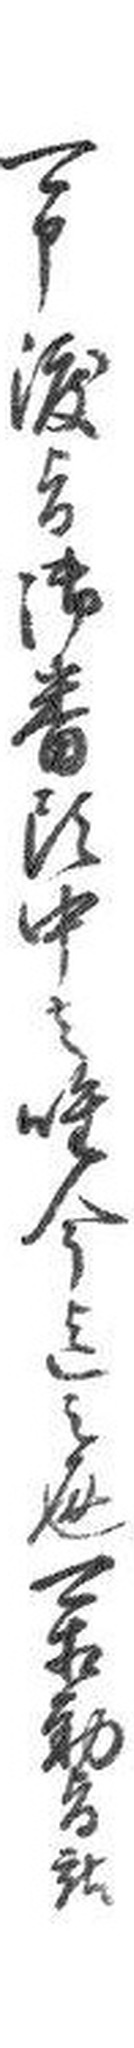可申渡旨御番頭中者唯今迄之通可相勤旨被
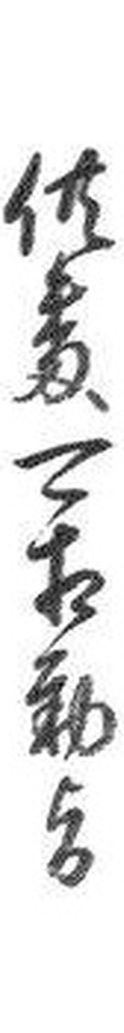供番可相勤旨
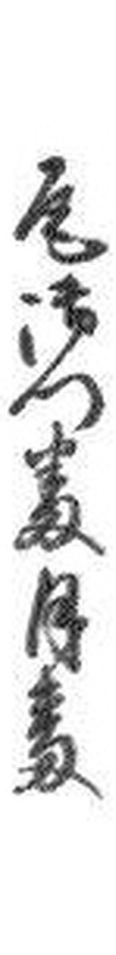瓦御門番月番
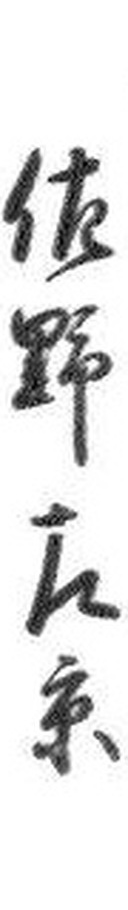佐野左京
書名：家譜 十一 昌親公 従延宝二年到延宝四年八月
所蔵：福井県文書館 Fukui Prefectural Archives
